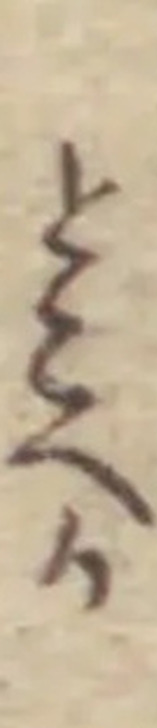とこへか
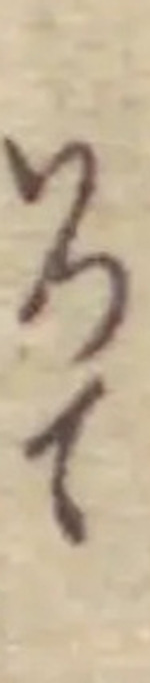いつて
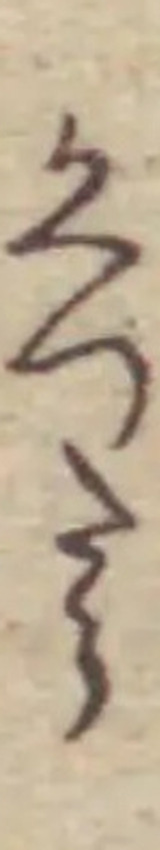かへつたら
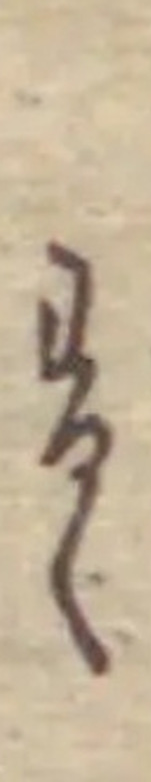わるく
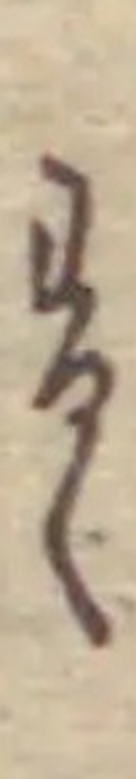わるく
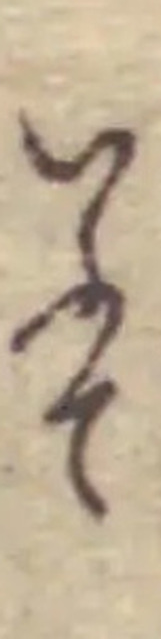いふて
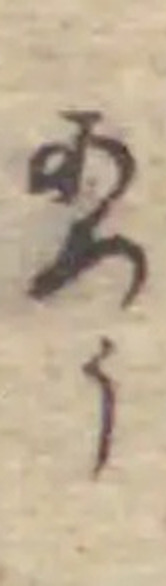あろう

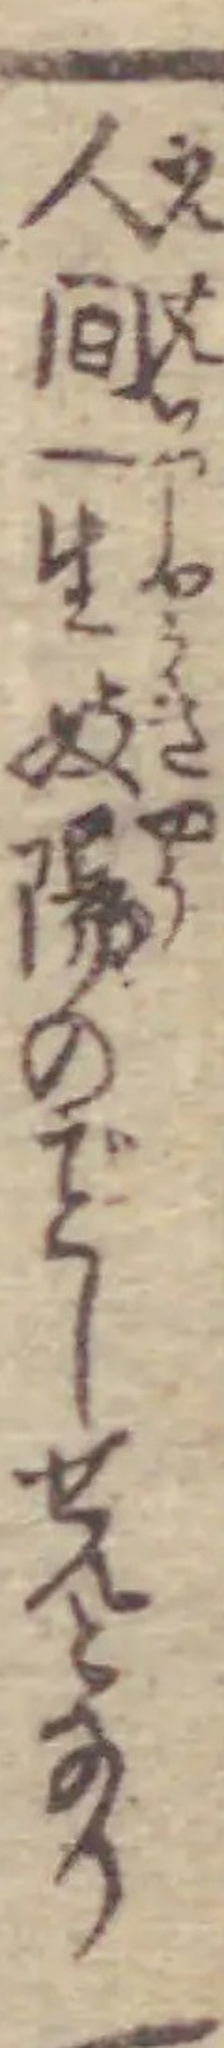人間一生妓陽のごとしせんとなり
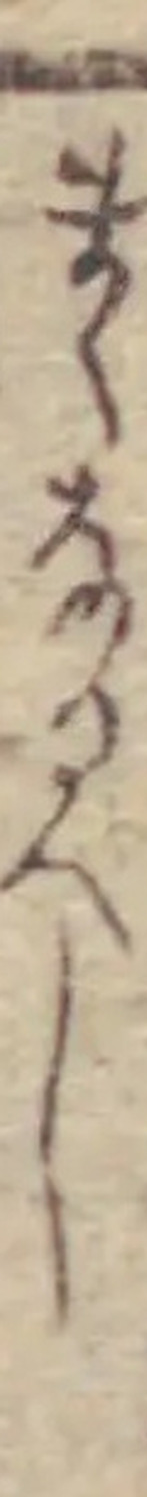まくなるへし
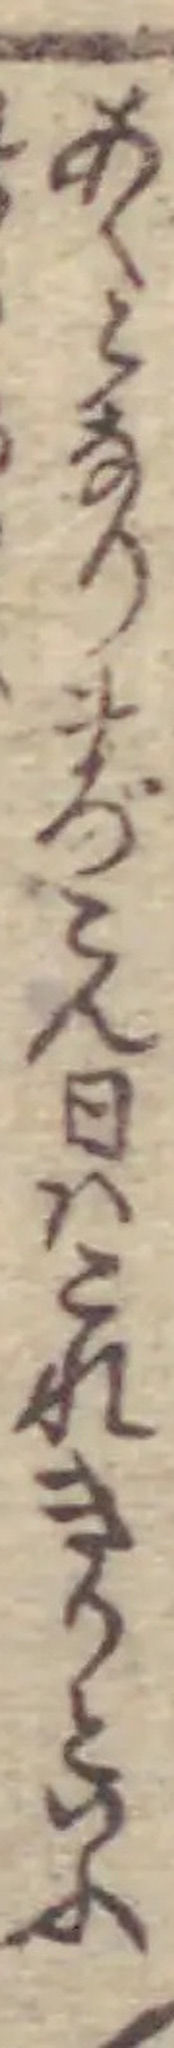あくとなりまづこん日はこれきりといふ
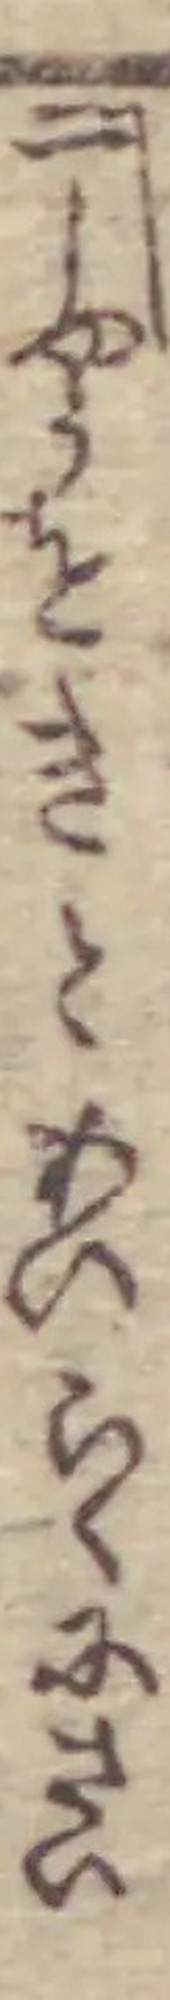〽一しやうをきとあいらくにさい
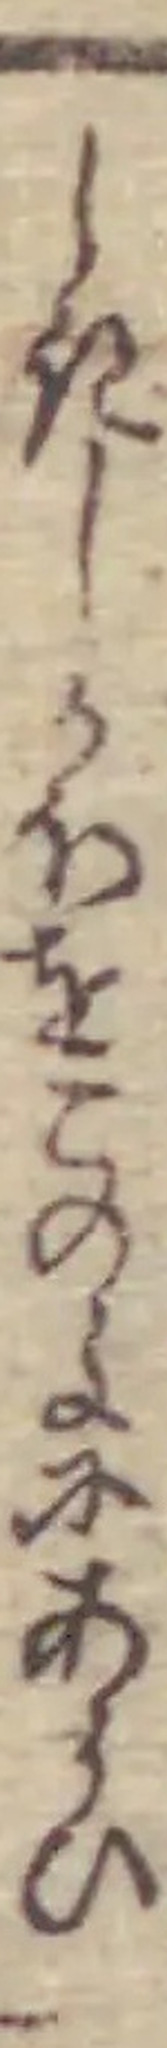しきしかほをこのよにあらひ
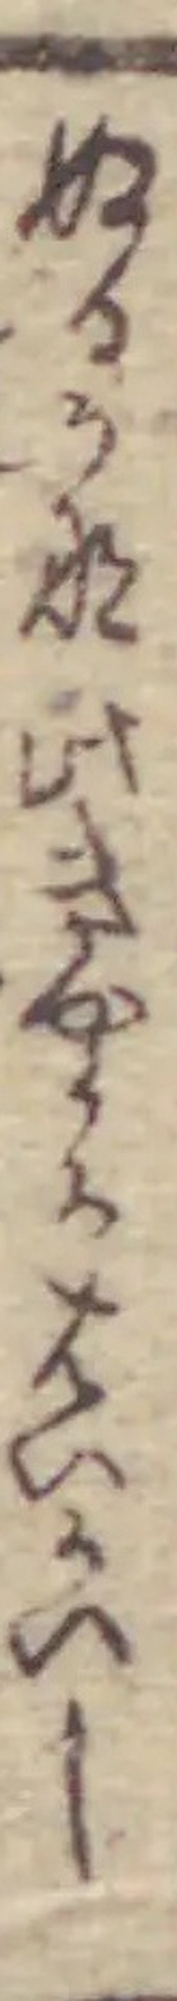ぬるかな此きやうかはいかいし
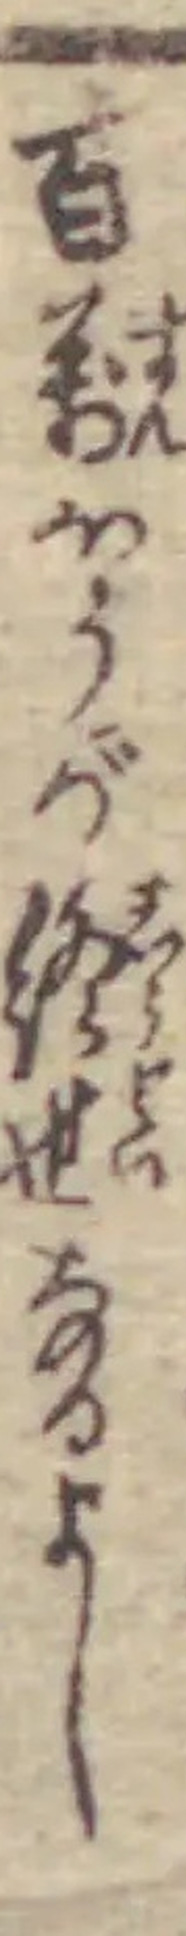百万ほうが終世なるよし
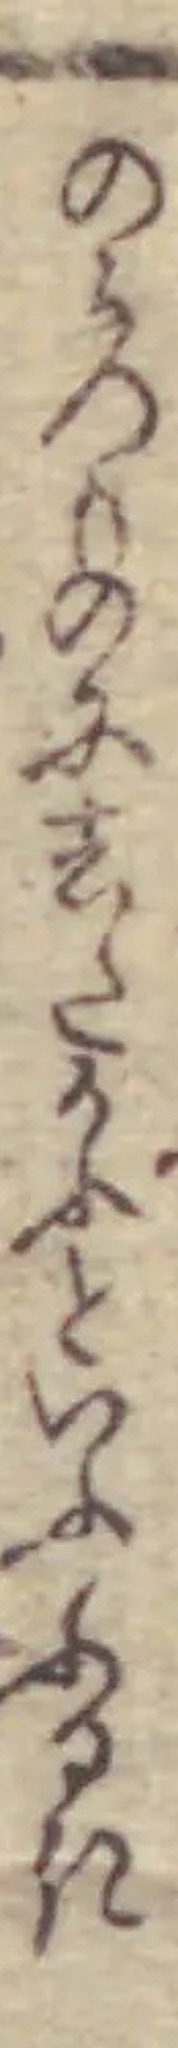のうつものにしたかふといふふるき
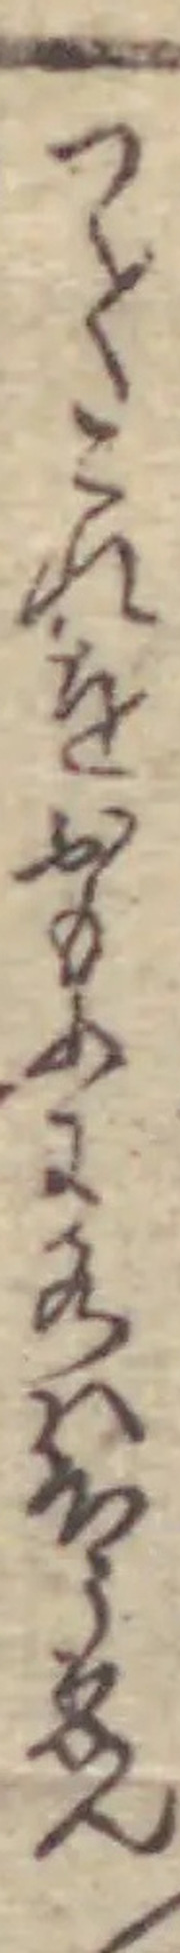つく〳〵これをおもふに水はほうゑん
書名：夜野中狐物 2巻
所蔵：国立国会図書館 National Diet Library, JAPAN
